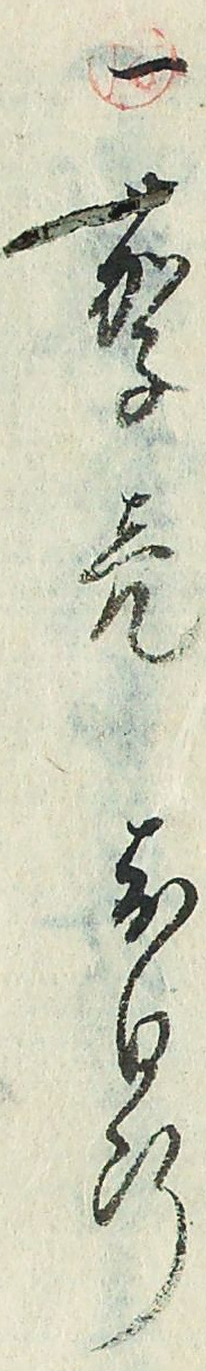一茄子売前同断

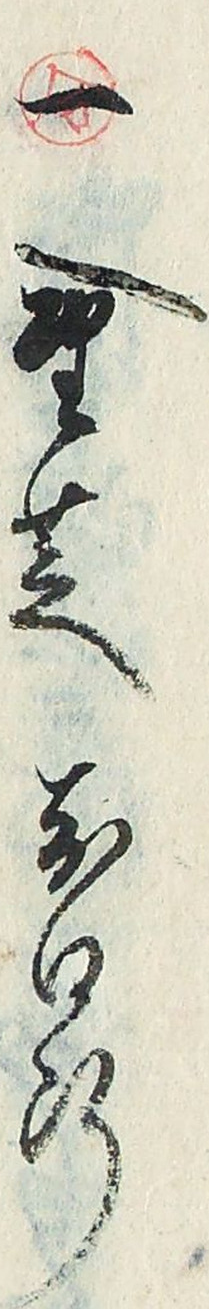一野芝前同断
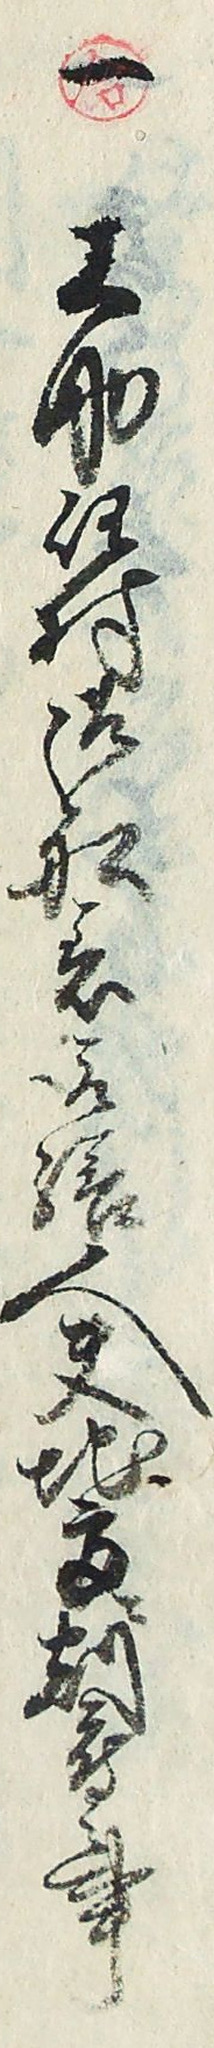一上助任村御船着取繕人夫地方に割符の事
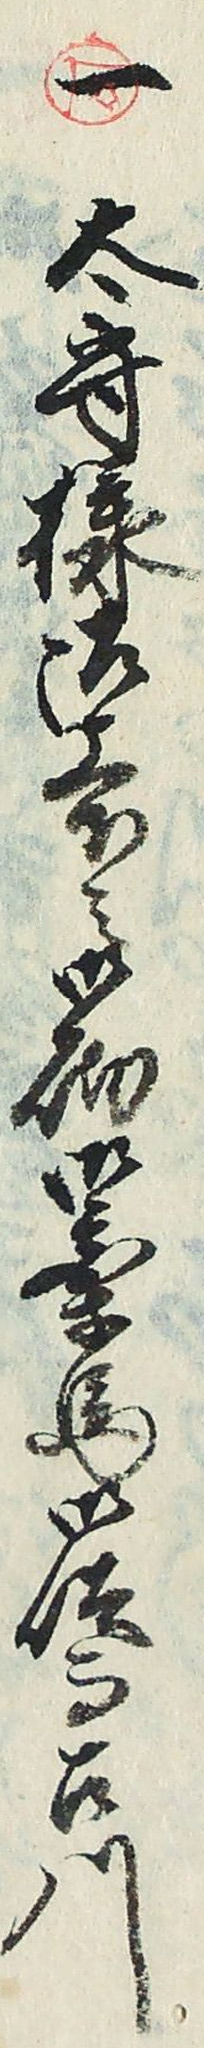一太守様御上下の御砌御牽馬御供馬古川
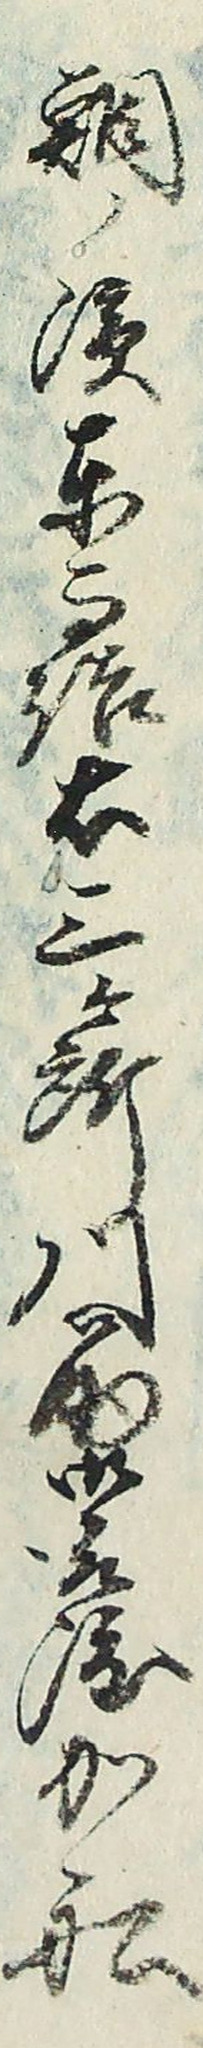鯛の浜東馬詰右三ヶ所川筋御取渡加船
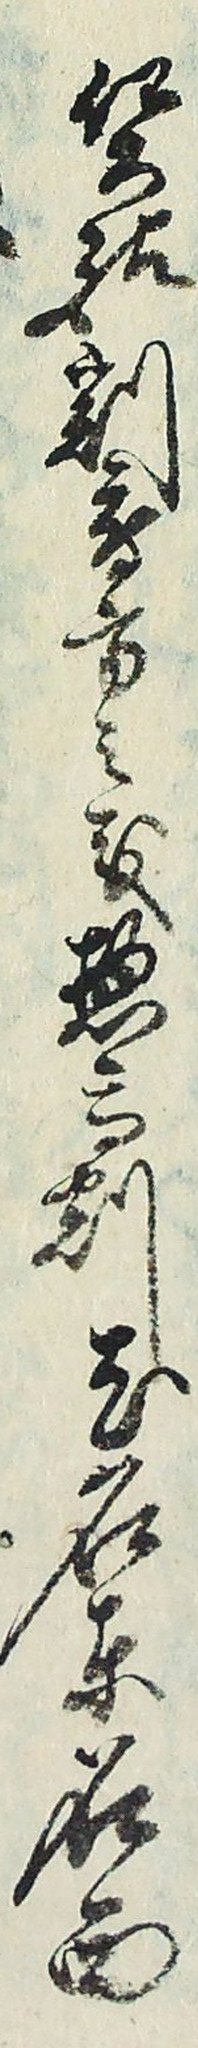賃銀割符方の義惣高割尤名東名西
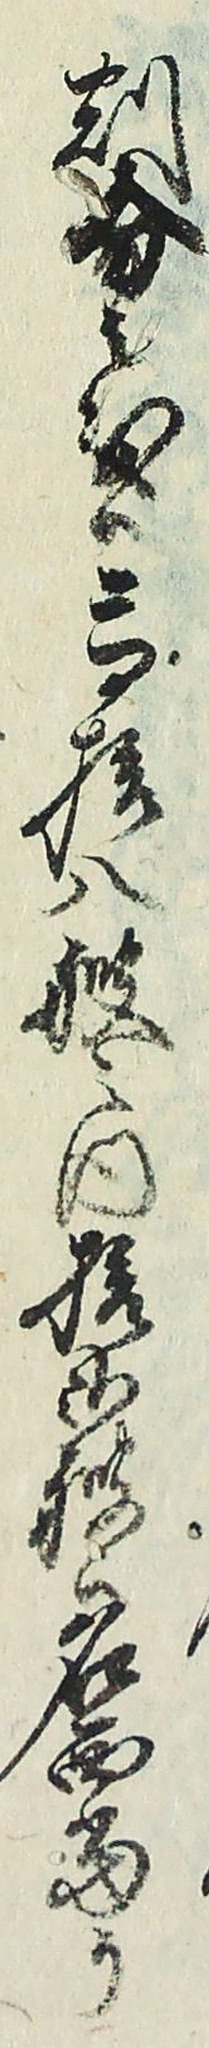割分の義は高十八艘の内十二艘は名西当り
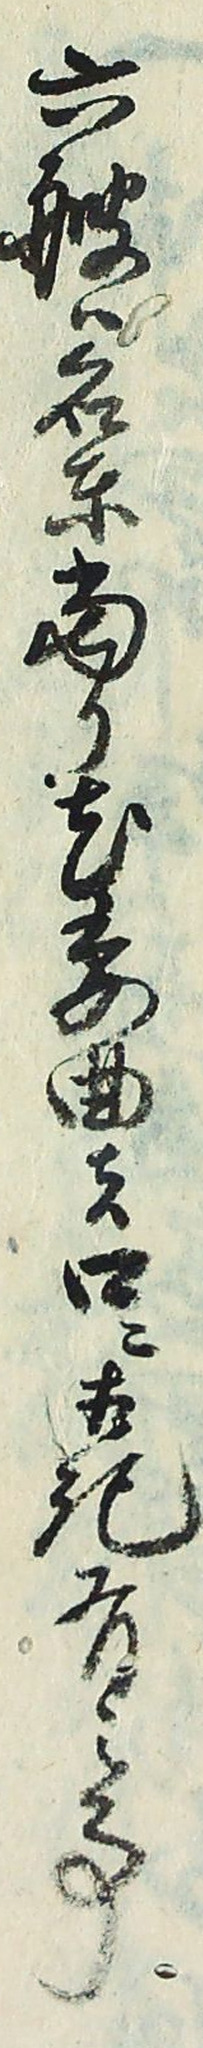六艘は名東当り尤委曲は口に相記有之事
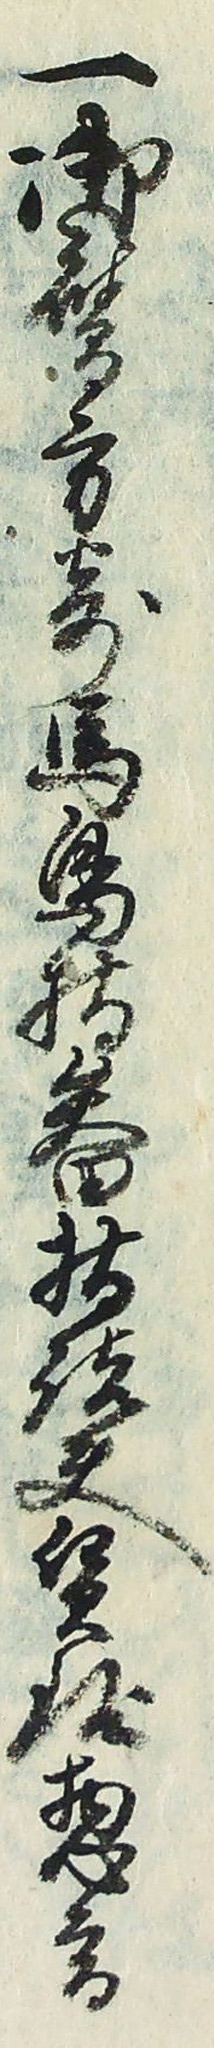一御鷹方寄馬鳥持畚持詰夫賃銀惣高
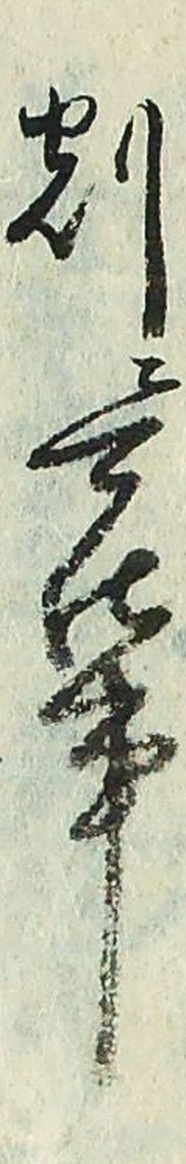割に可仕事
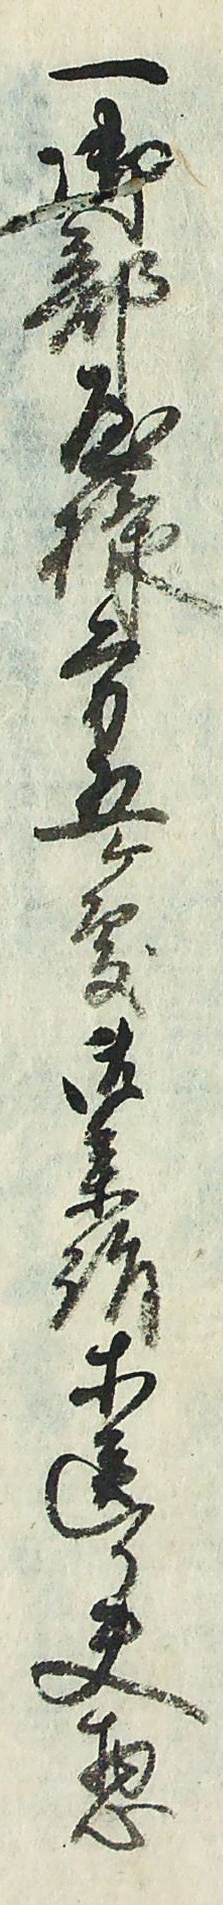一御部屋様方五ヶ処御参詣等送り夫惣

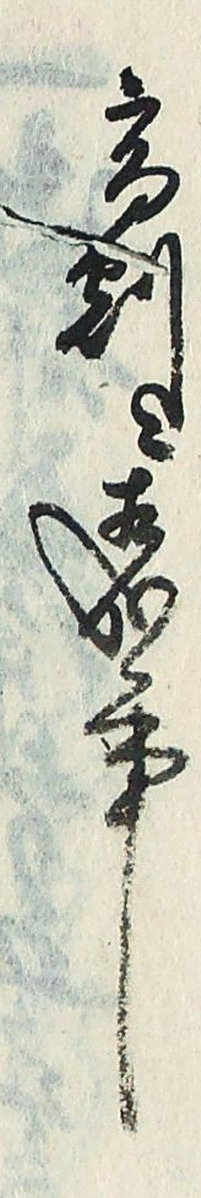高割に相成候事
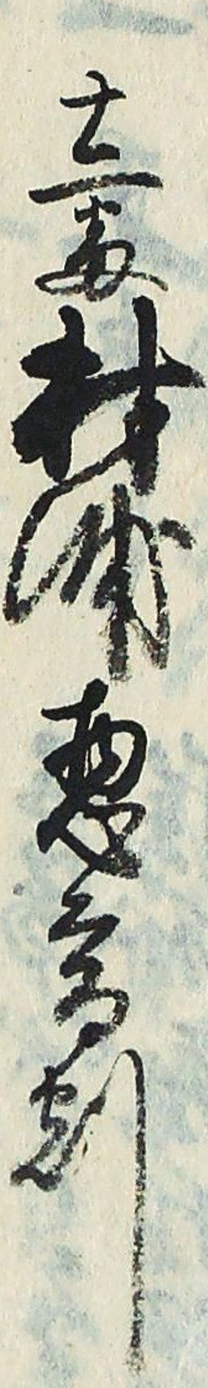十二番村浦惣高割
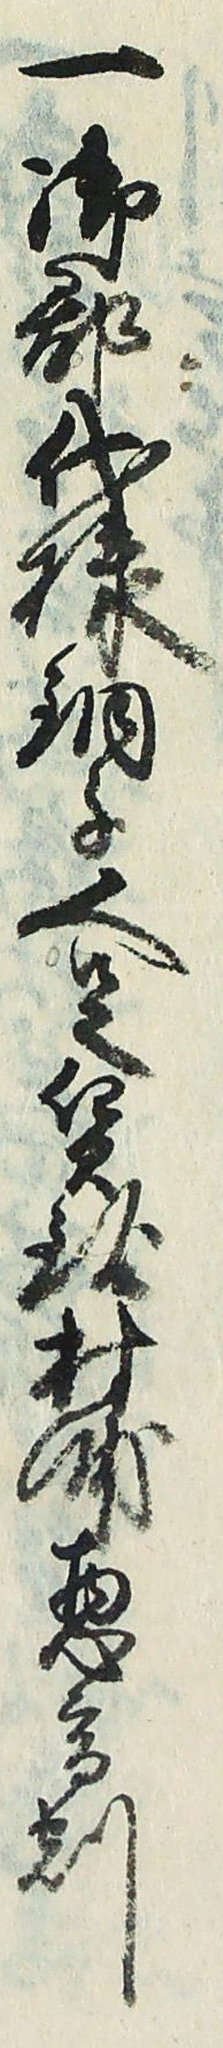一御郡代様銅子人足賃銀村浦惣高割
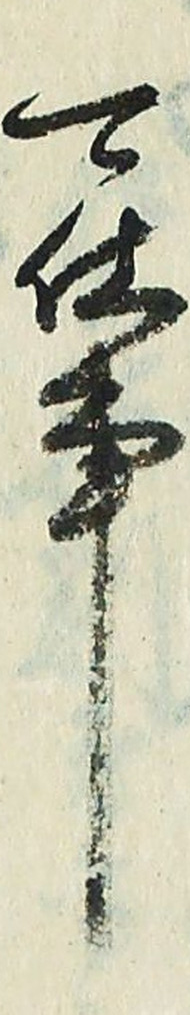可仕事
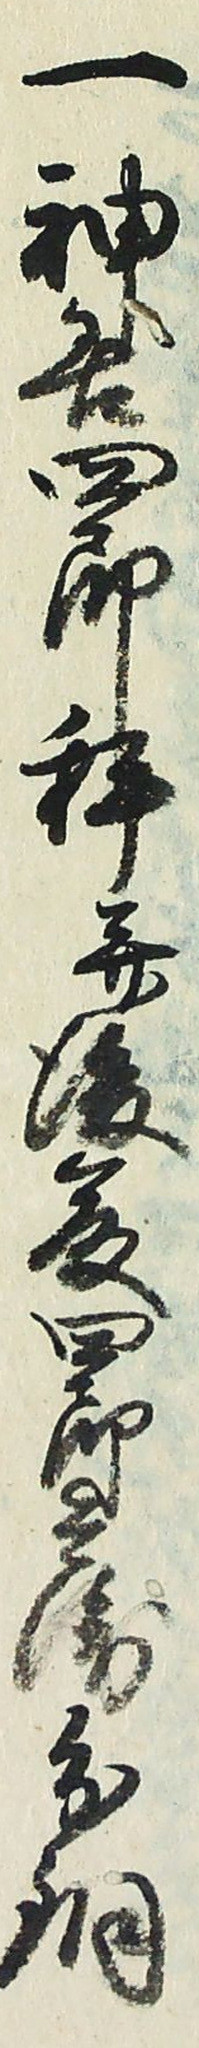一神善四郎秤幷後藤四郎兵衛分銅
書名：諸割賦物賃銀定記録帳
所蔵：鳴門教育大学 Naruto University of Education
